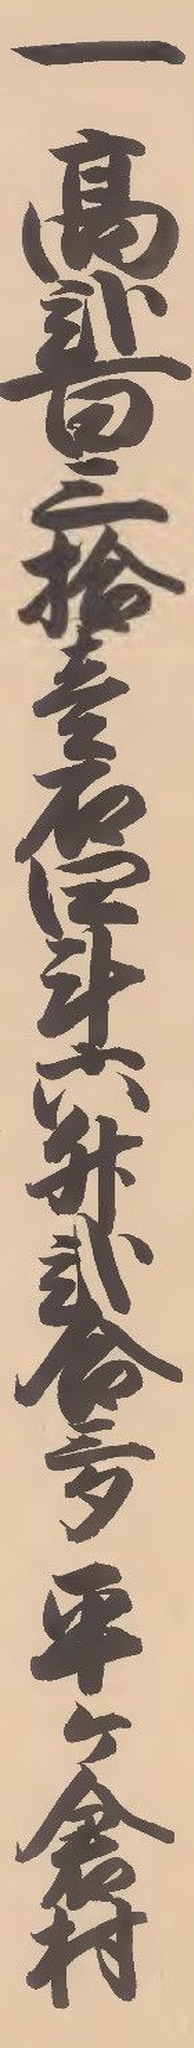一弐百三拾壱石四斗六升弐合三夕平ケ倉村
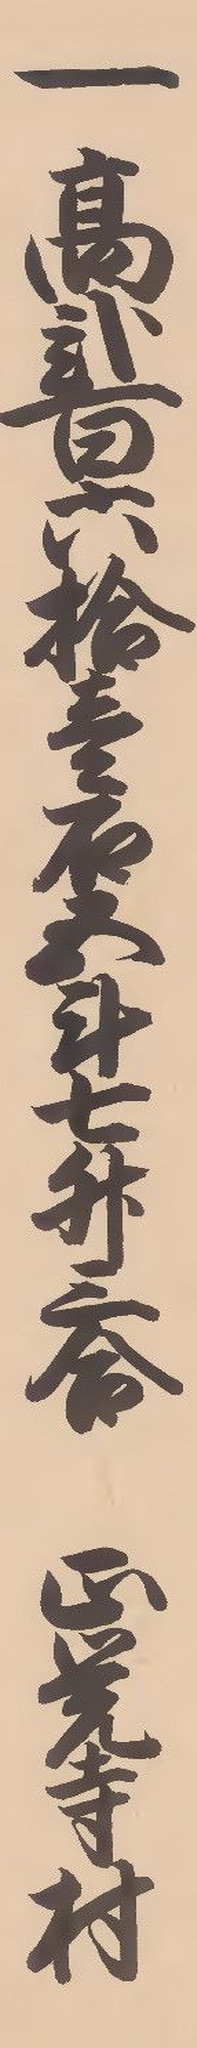一髙弐百六拾壱石五斗七升三合正覚寺村
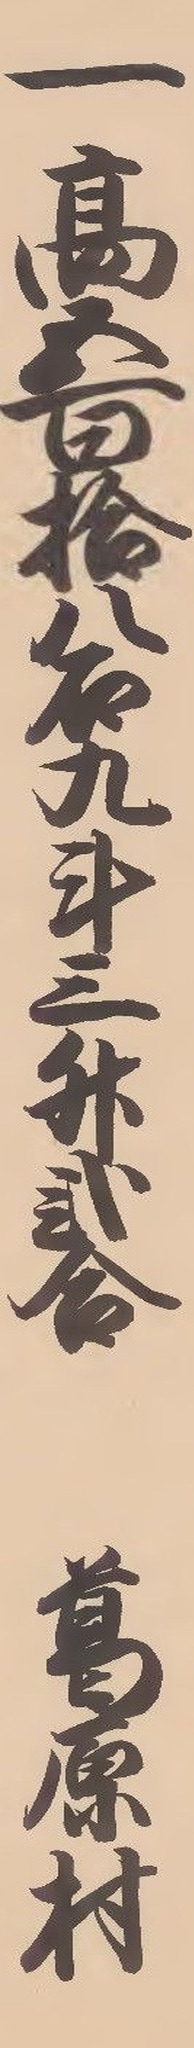一髙五百拾八石九斗三升弐合葛原村
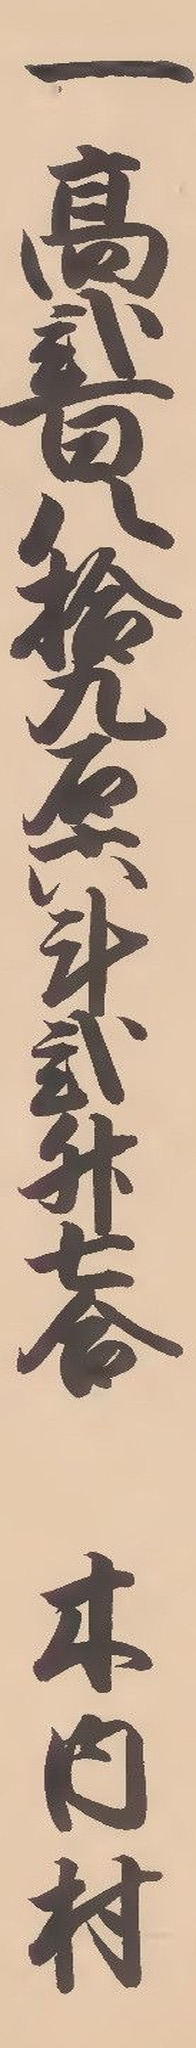一髙弐百八拾九石六斗弐升七合木内村
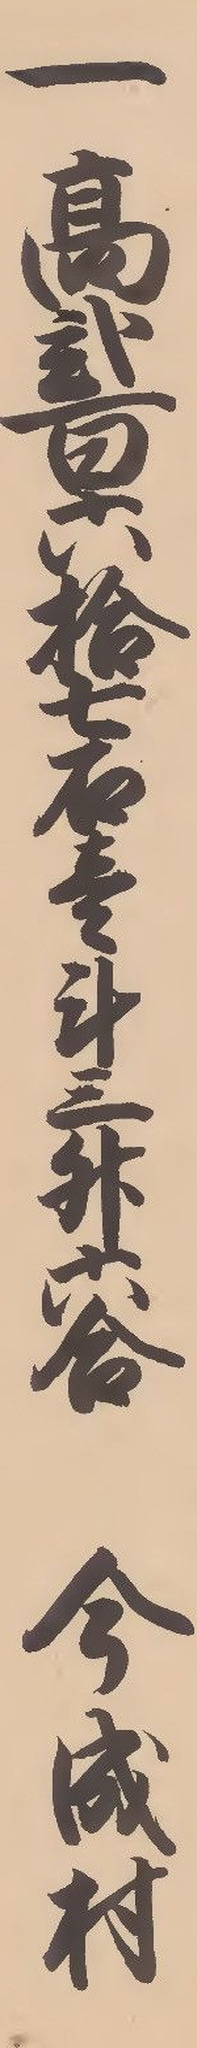一髙弐百六拾七石壱斗三升六合今成村
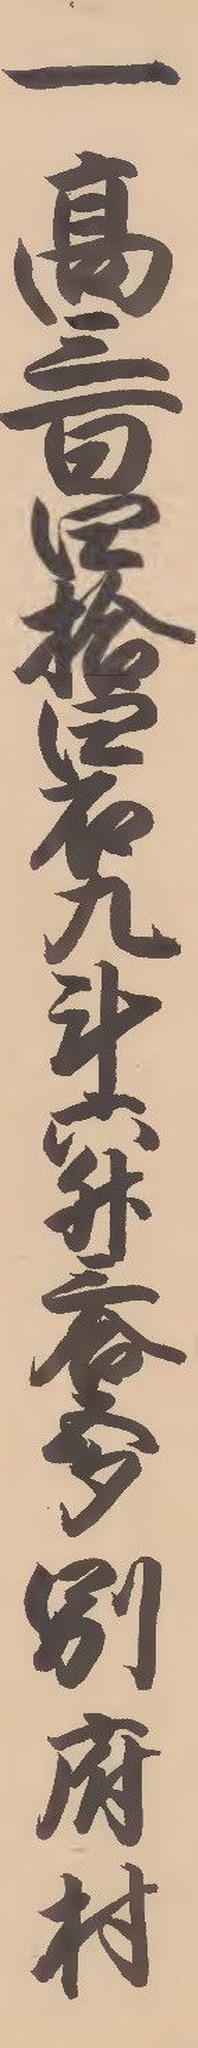一髙三百四拾四石九斗六升三合五夕別府村
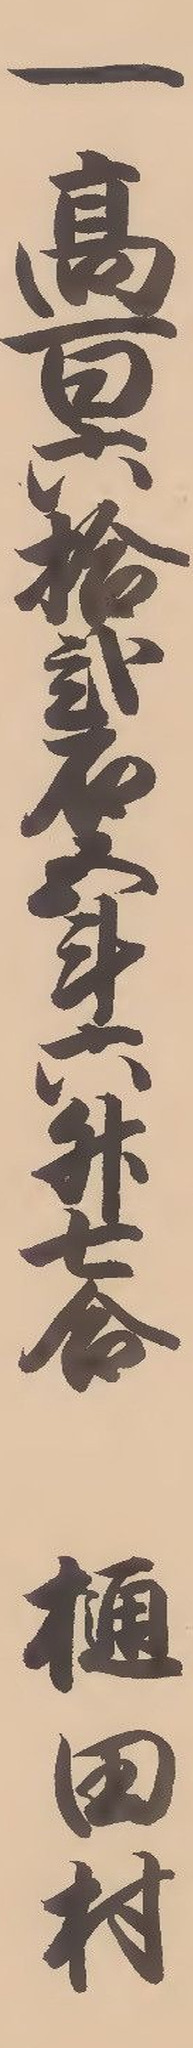一髙百六拾弐石五斗六升七合樋田村
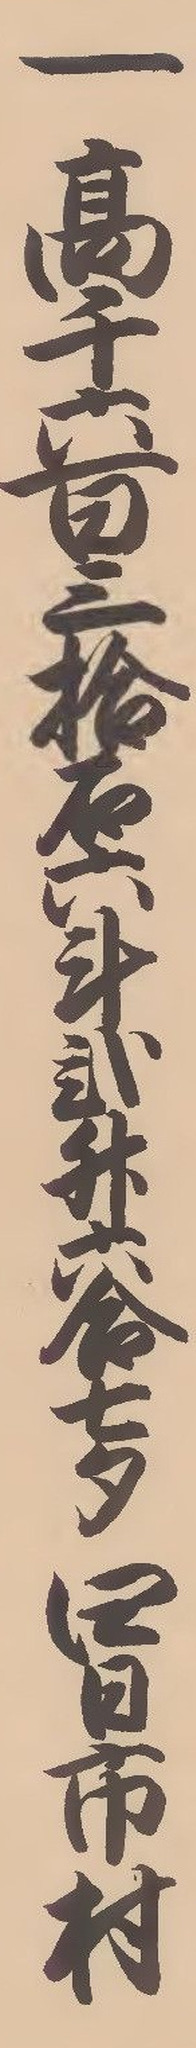一髙千六百三拾石六斗弐升六合七夕四日市村

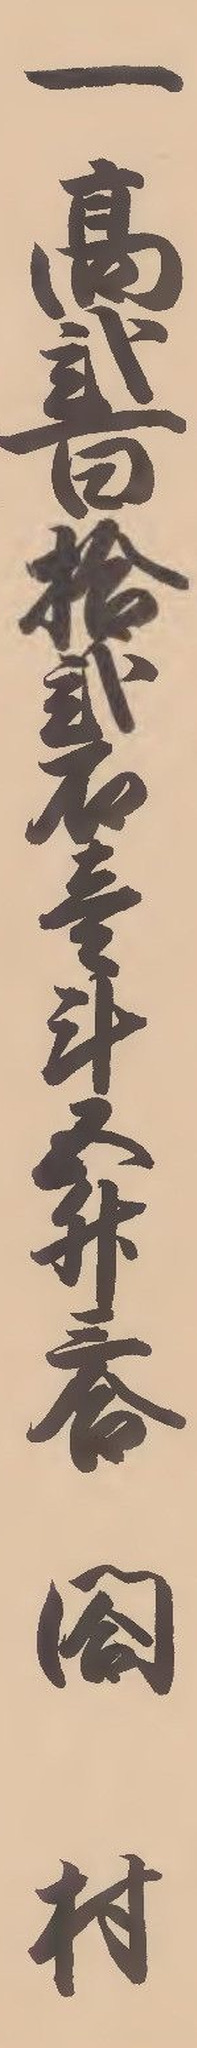一髙弐百拾弐石壱斗五升三合閤村
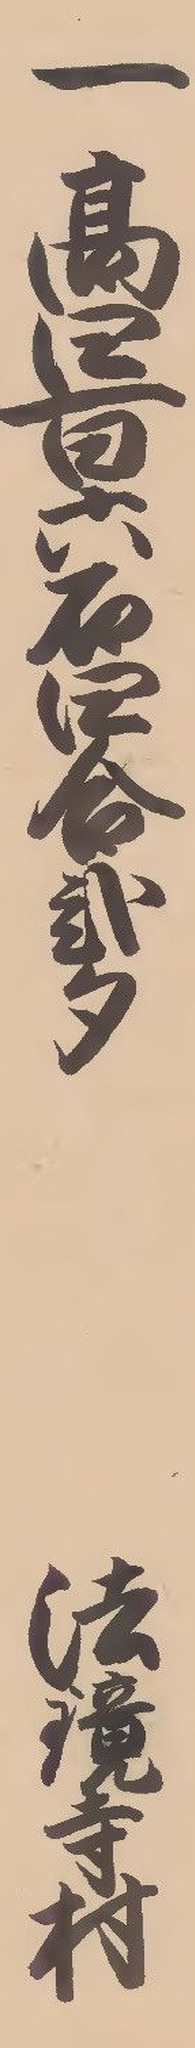一髙四百六石四合弐夕法鏡寺村
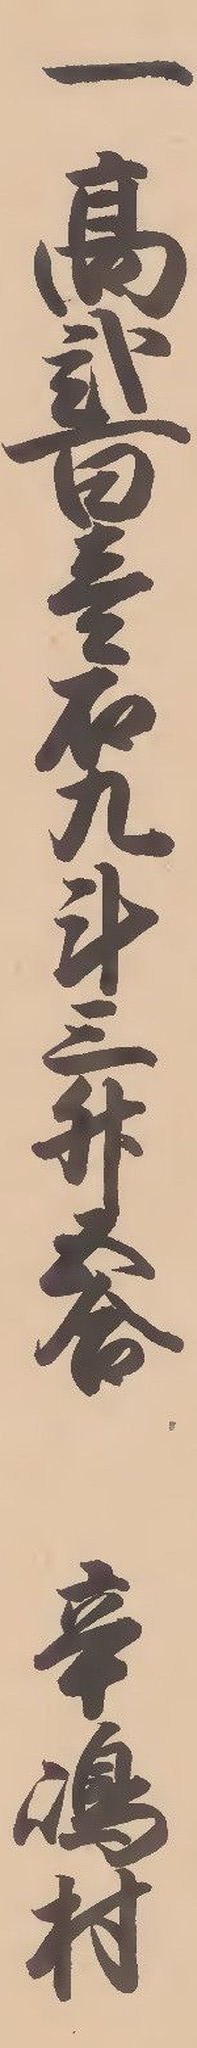一髙弐百壱石九斗三升五合辛嶋村
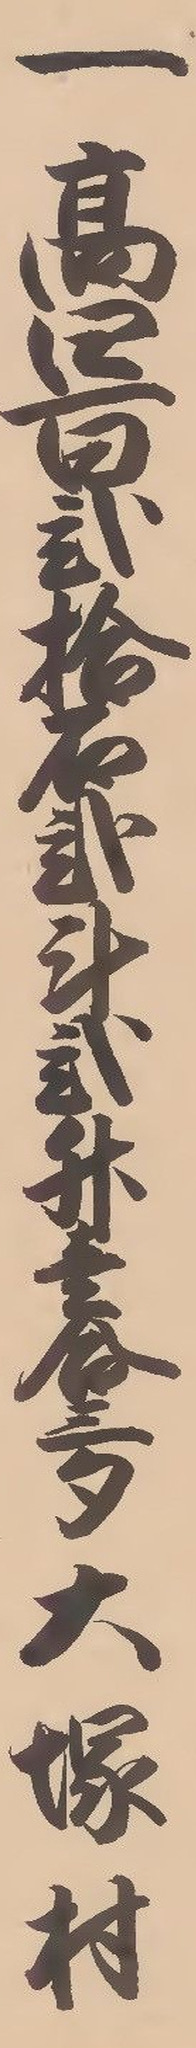一髙四百弐拾石弐斗弐升壱合三夕大塚村
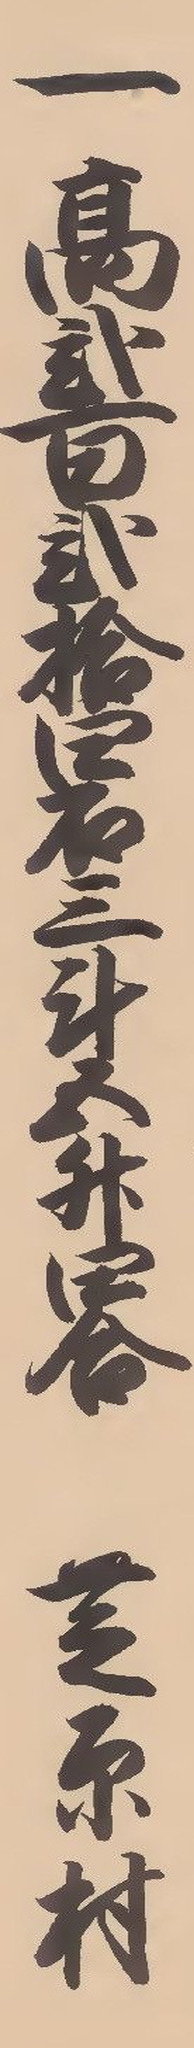一髙弐百弐拾四石三斗五升四合芝原村
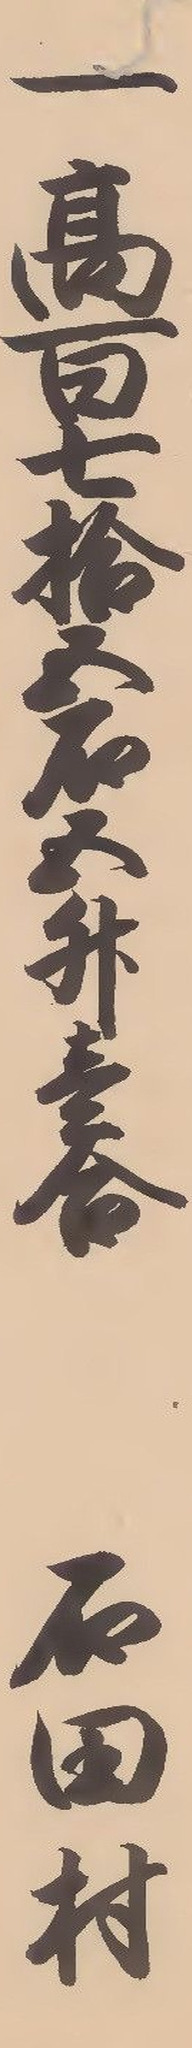一髙百七拾五石五升壱合石田村
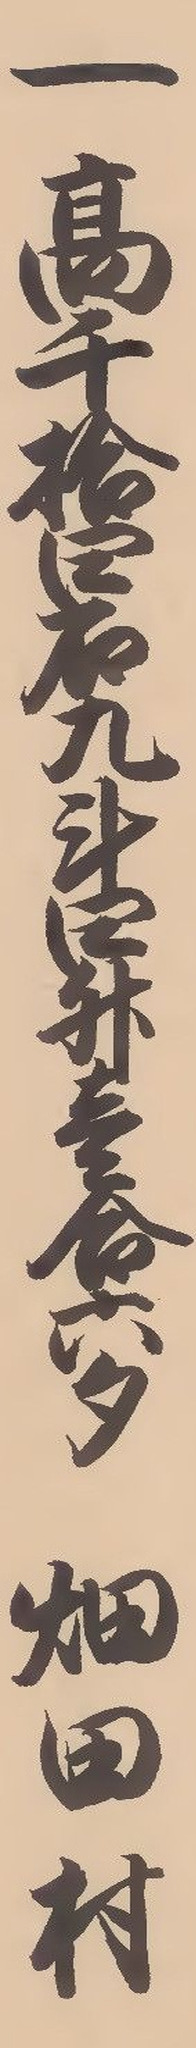一髙千拾四石九斗四升壱合六夕畑田村
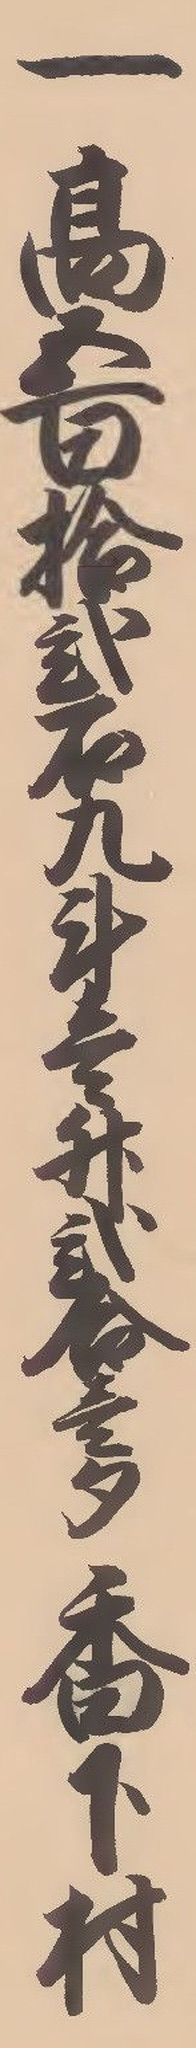一髙五百拾弐石九斗壱升弐合壱夕香下村
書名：豊前国郷帳
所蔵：国立公文書館 National Archives of Japan
